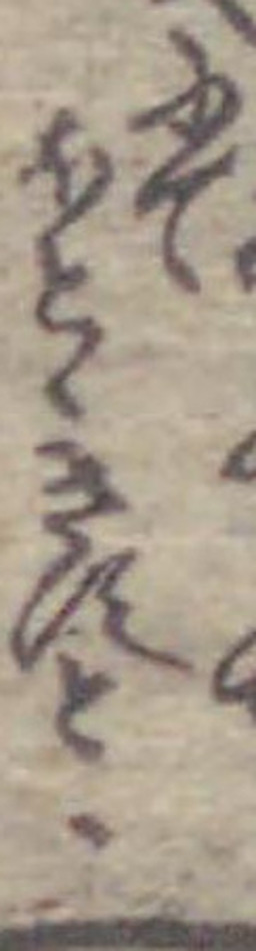ほとゝきすと
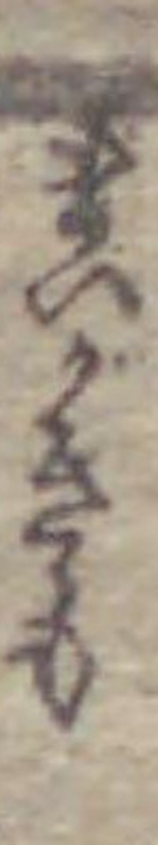まいがきも
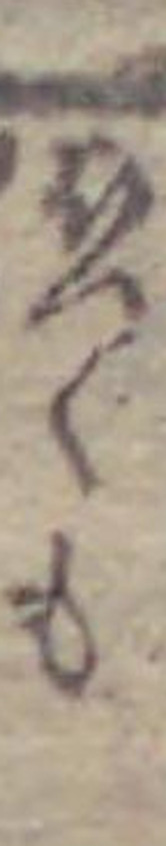ほつくも
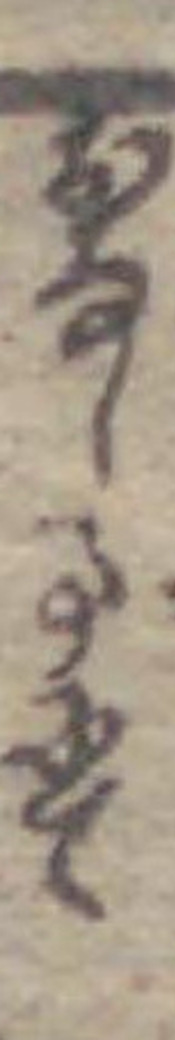おなし事にて
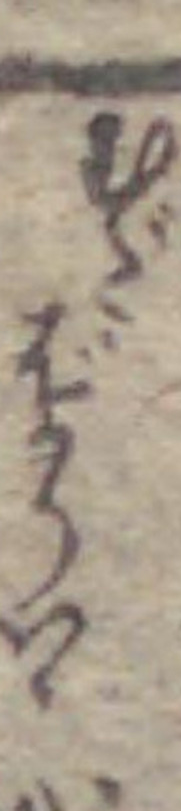むだばかりいゝ
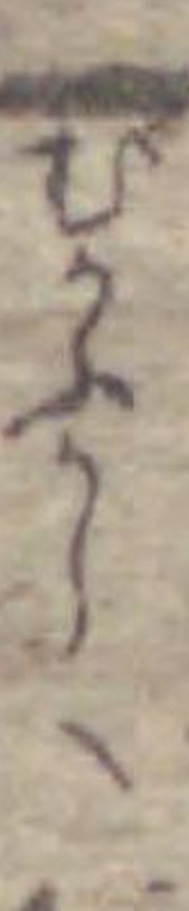むかふかしへ
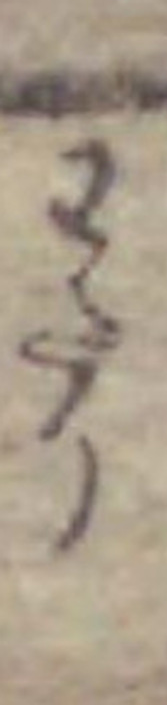わたり
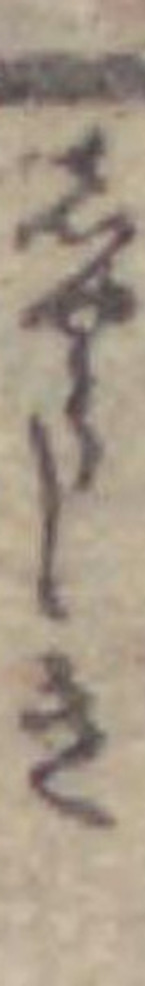しやうしき
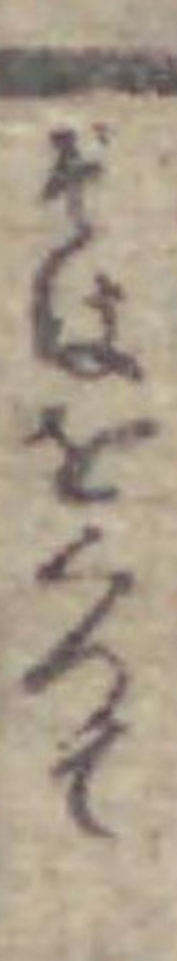そばをくつて

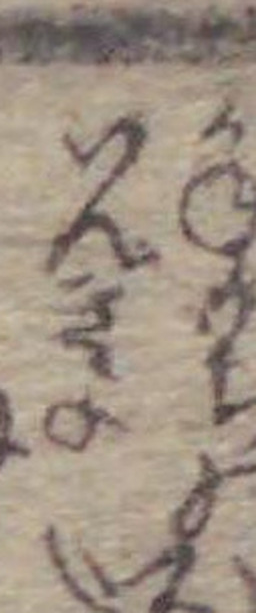いんきよ
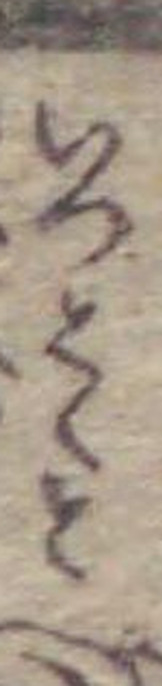いつとくと
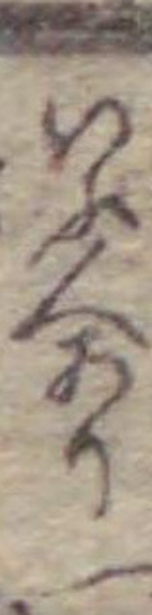いふ人あり
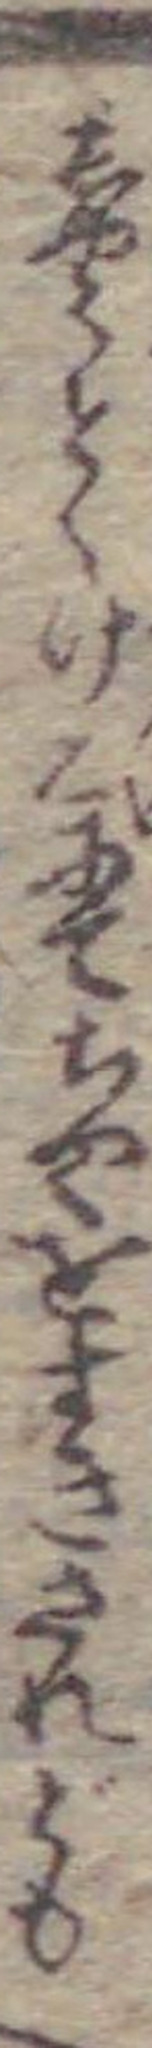しやうとくけこにてちやをすきされども
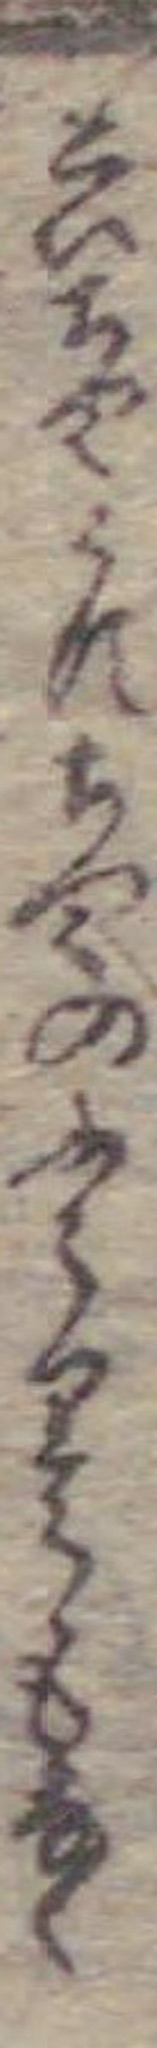こいちやうすちやのふうりうもなく
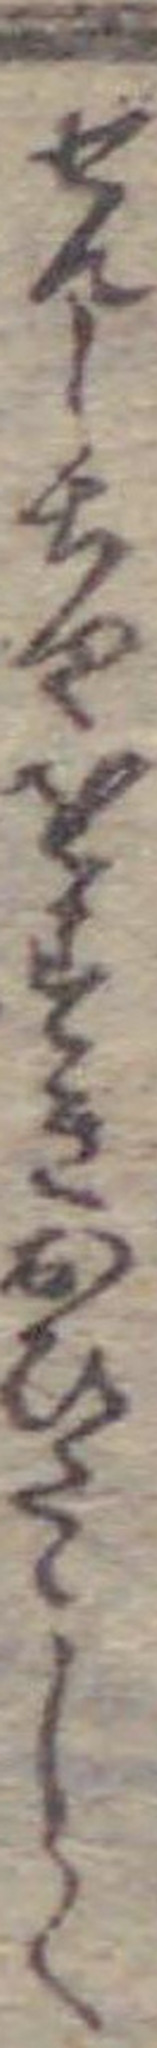せんしちやをすきおひたゝしく
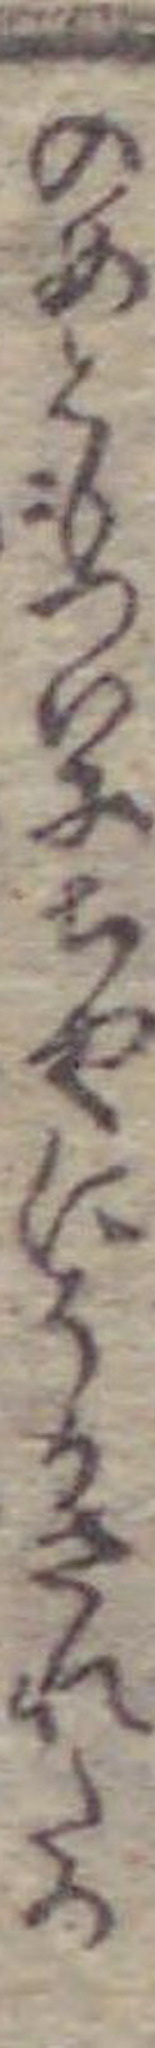のめともついにちやにうかされたる
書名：見通占 : 3巻
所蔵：国立国会図書館 National Diet Library, JAPAN
